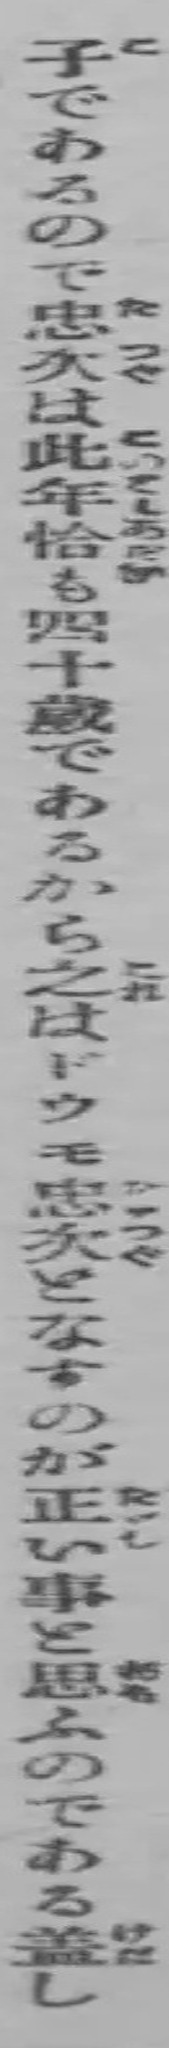子であるので忠次は此年恰も四十歳であるから之はドウモ忠次となすのが正い事と思ふのである蓋し
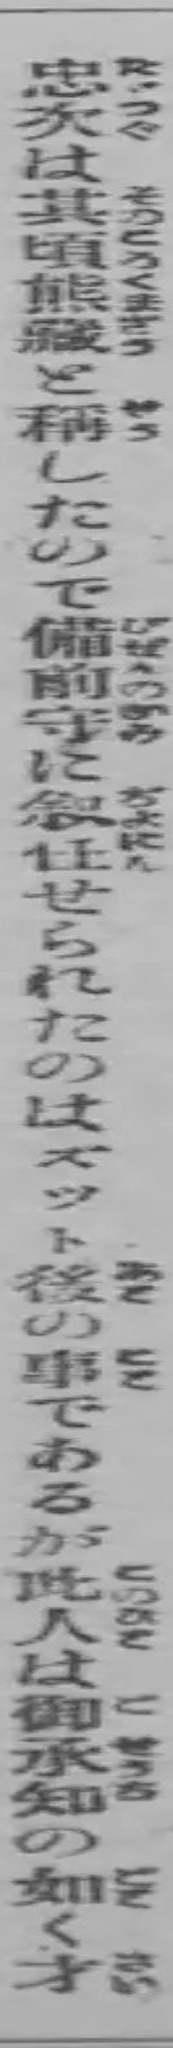忠次は其頃熊藏と称したので備前守に叙任せられたのはズツト後の事であるが此人は御承知の如く才
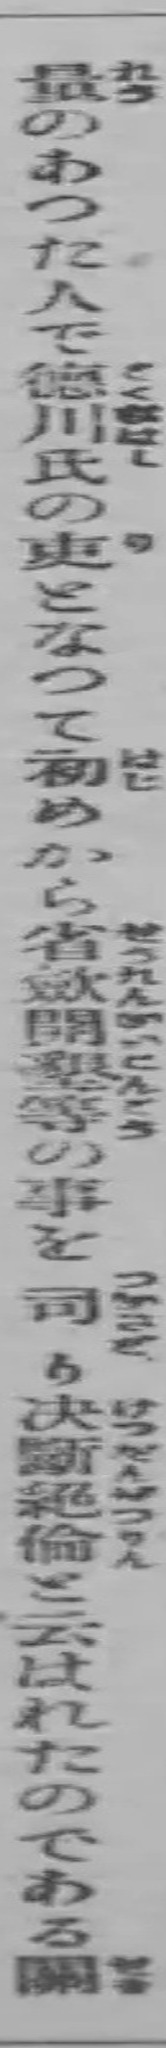量のあつた人で徳川氏の吏となつて初めから省歛開墾等の事を司り決断絶倫と云はれたのである関
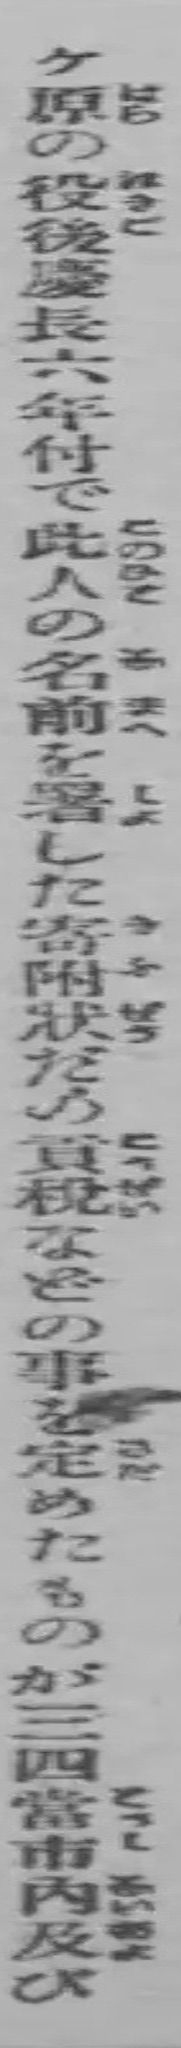ケ原の役後慶長六年付で此人の名前を署した寄附状だの貢税などの事を定めたものが三四当市内及び
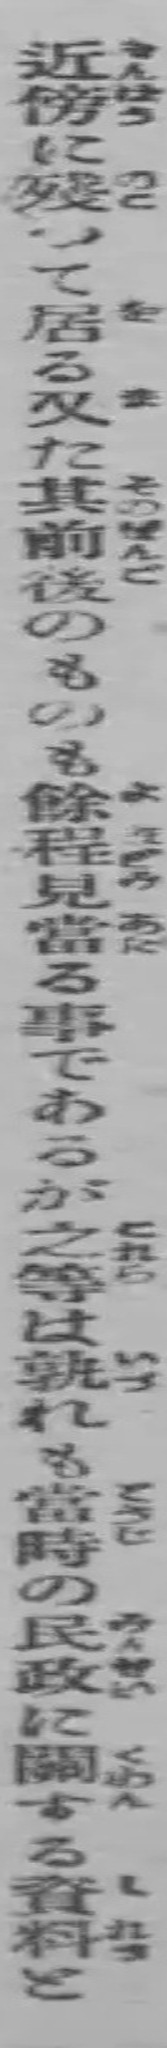近傍に残つて居る又た其前後のものも余程見当る事であるが之等は孰れも当時の民政に関する資料と
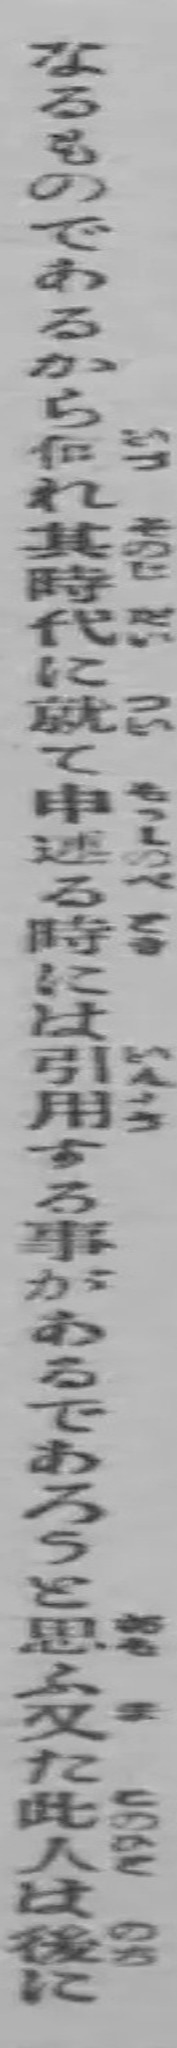なるものであるから何れ其時代に就て申述る時には引用する事があるであろうと思ふ又た此人は後に
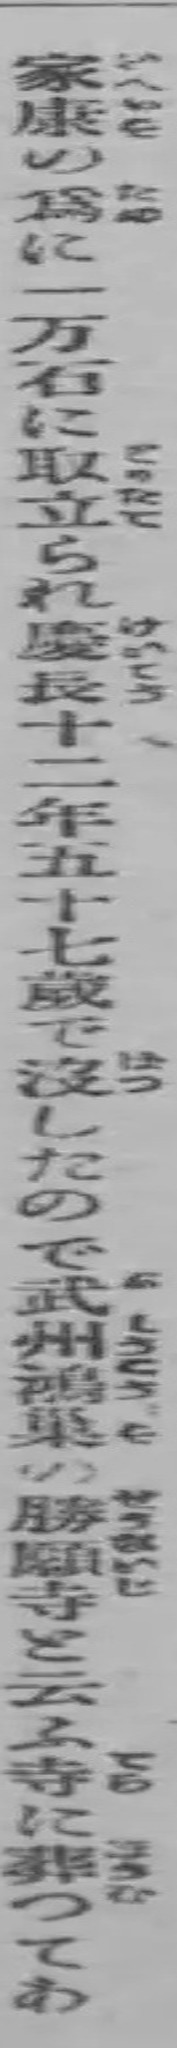家康の為に一万石に取立られ慶長十二年五十七歳で没したので武州鴻巣の勝願寺と云ふ寺に葬つてあ
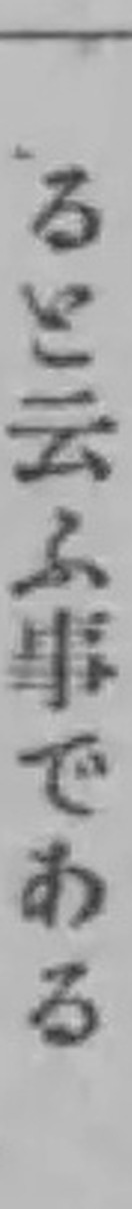ると云ふ事である
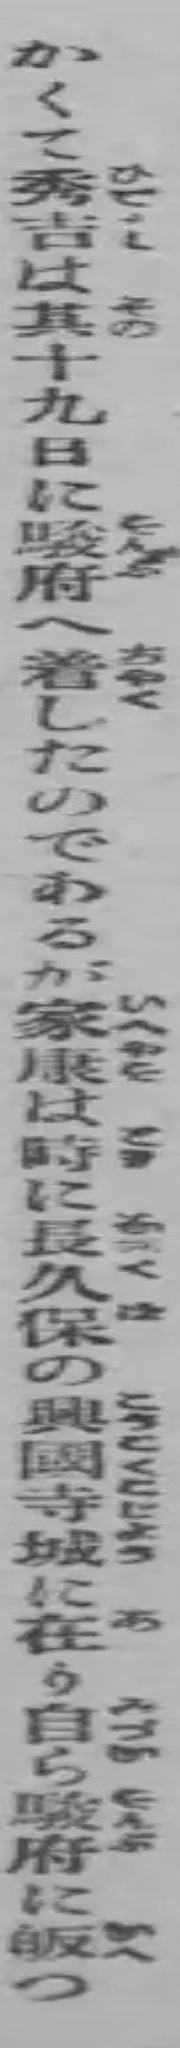かくて秀吉は其十九日に駿府へ着したのであるが家康は時に長久保の興国寺城に在り自ら駿府に皈つ
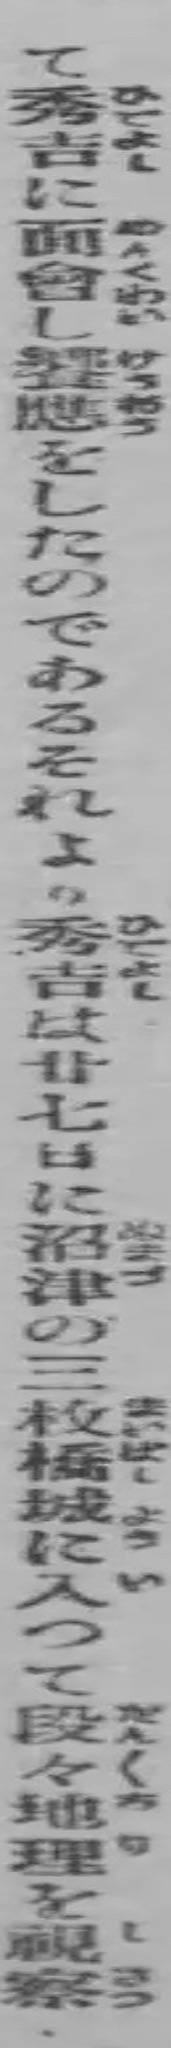て秀吉に面会し饗応をしたのであるそれより秀吉は廿七日に沼津の三枚橋城に入つて段々地理を視察
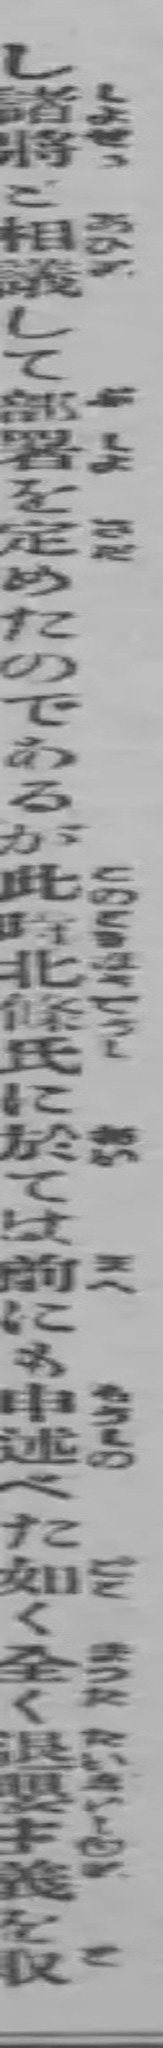山中城陥るし諸将と相議して部署を定めたのであるが此時北條氏に於ては前にも申述べた如く全く退嬰主義を取
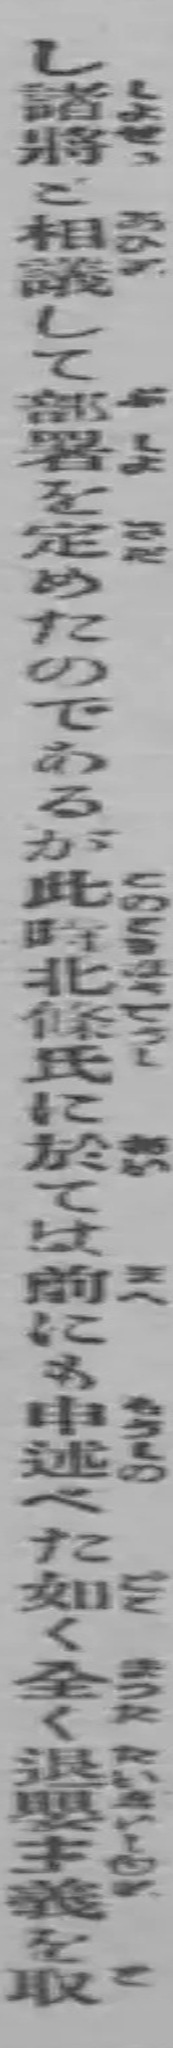山中城陥るし諸将と相議して部署を定めたのであるが此時北條氏に於ては前にも申述べた如く全く退嬰主義を取
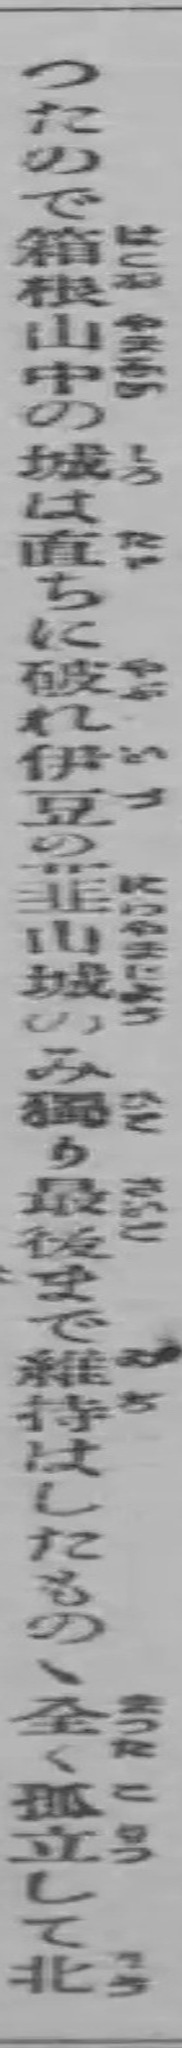韮山の孤立つたので箱根山中の城は直ちに破れ伊豆の韮山城のみ独り最後まで維持はしたものゝ全く孤立して北
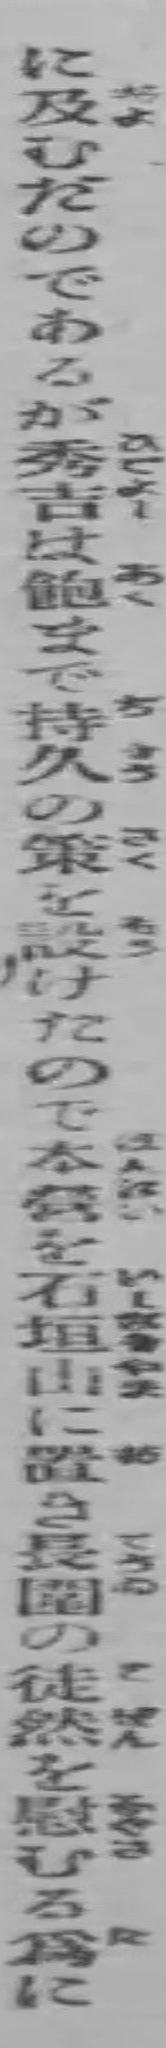に及むだのであるが秀吉は飽まで持久の策を設けたので本営は石垣山に置き長囲の徒然を慰むる為に
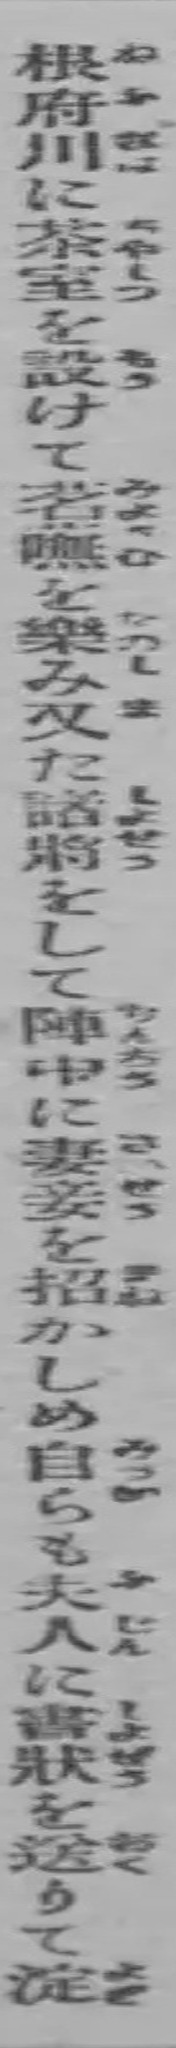根府川に茶室を設けて茗嘸を楽み又た諸将をして陣中に妻妾を招かしめ自らも夫人に書状を送りて淀
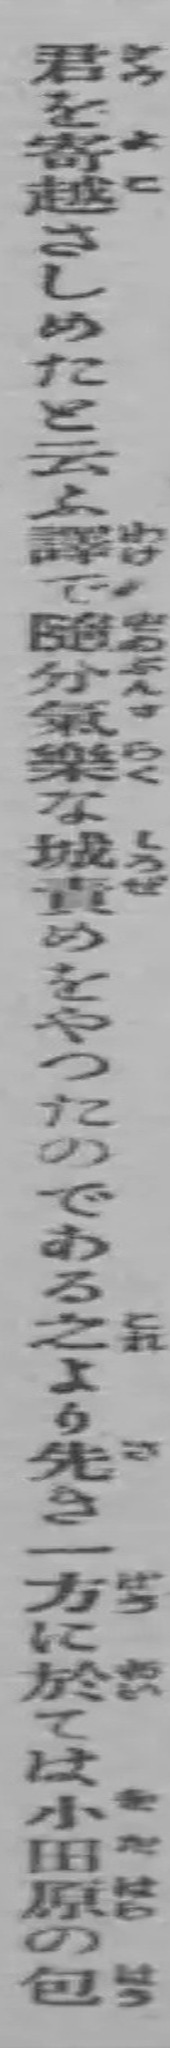君を寄越さしめたと云ふ訳で随分気楽な城責めをやつたのである之より先き一方に於ては小田原の包
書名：豊橋市史談
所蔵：国立国会図書館 National Diet Library, JAPAN
